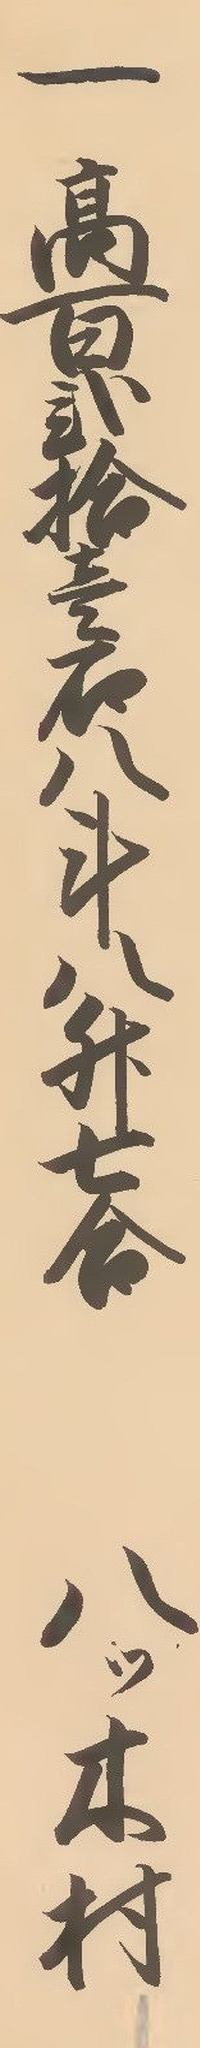一高百弐拾壱石八斗八升七合八ツ木村

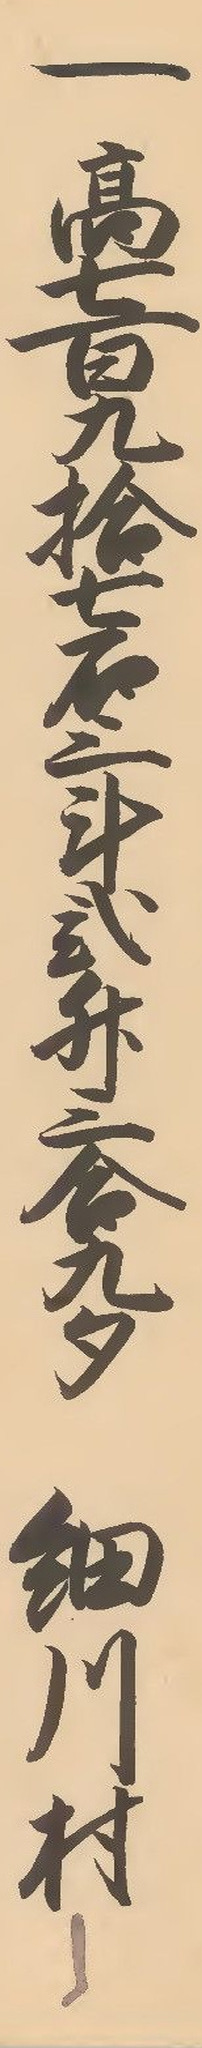一高七百九拾七石三斗弐升三合九勺細川村
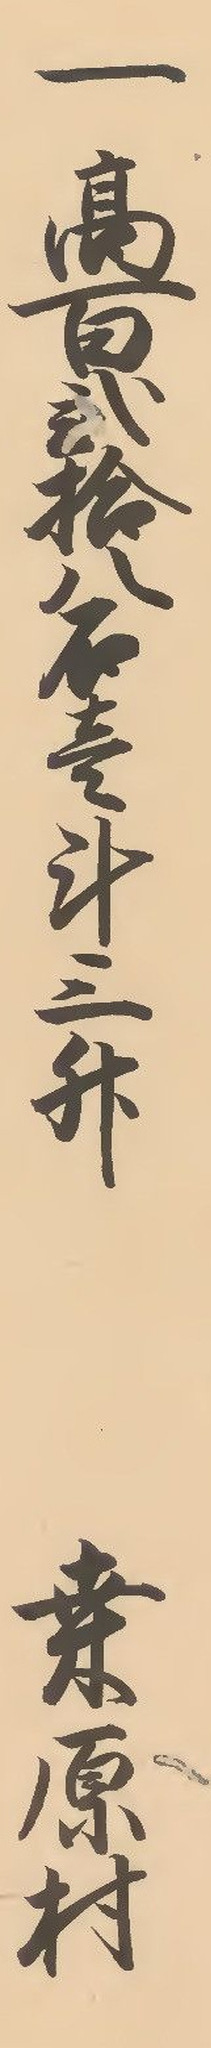一高百弐拾八石壱斗三升桑原村
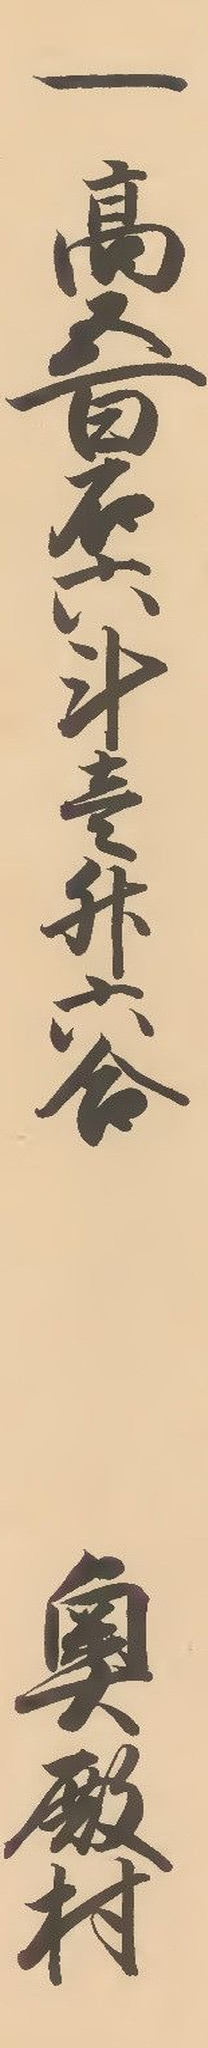一高五百石六斗壱升六合奥殿村
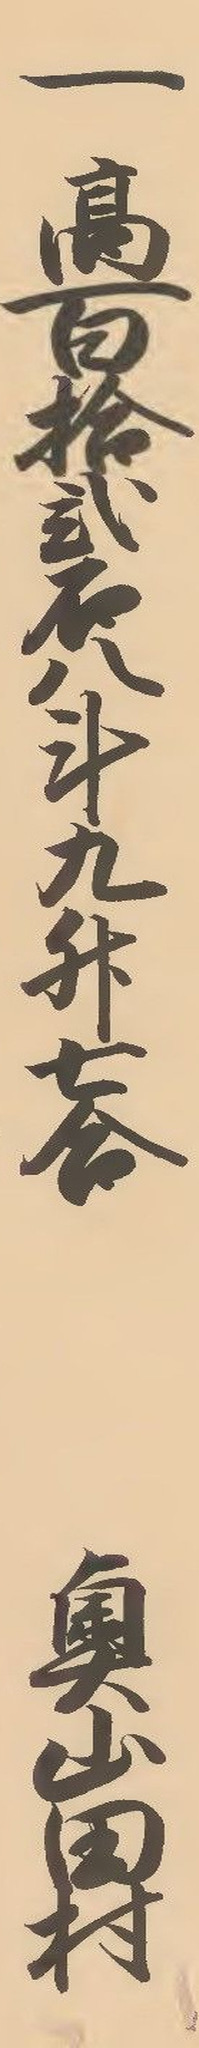一高百拾弐石八斗九升七合奥山田村
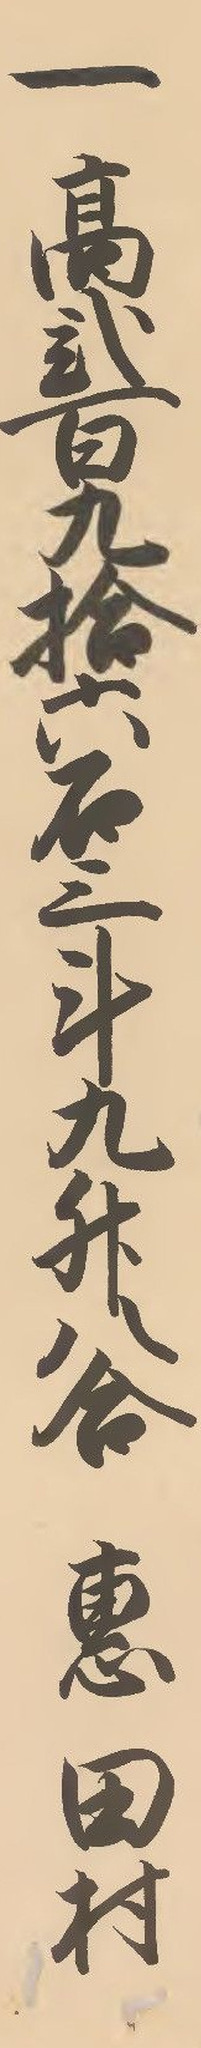一高弐百九拾六石三斗九升八合恵田村
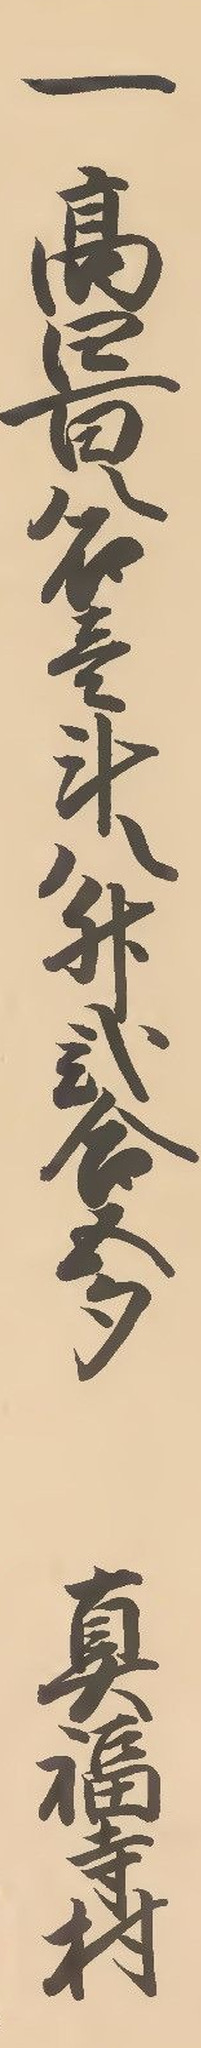一高四百八石壱斗八升弐合五勺真福寺村
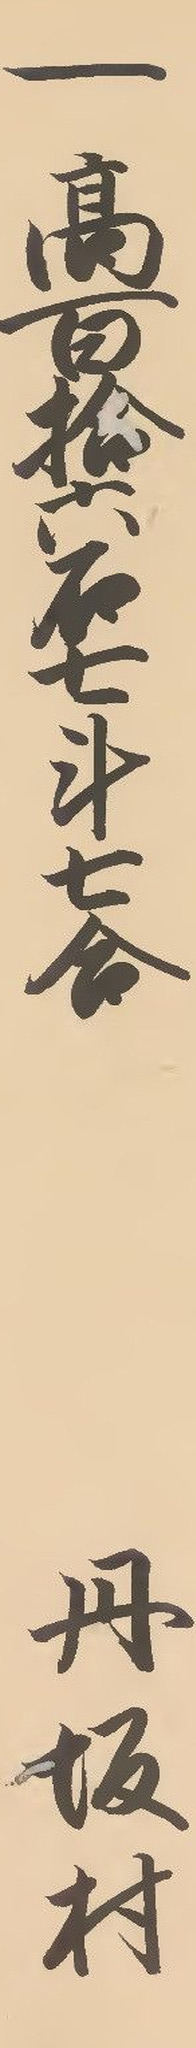一高百拾六石七斗七合丹坂村
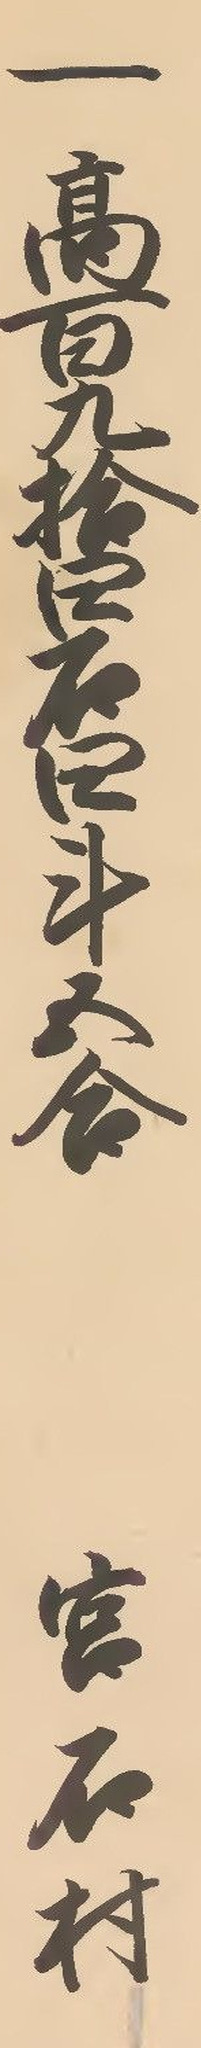一高百九拾四石四斗五合宮石村

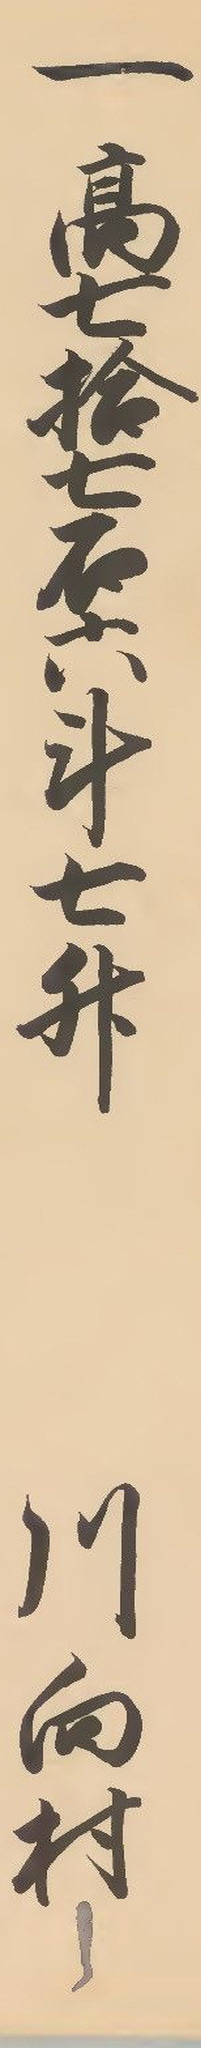一高七拾七石六斗七升川向村
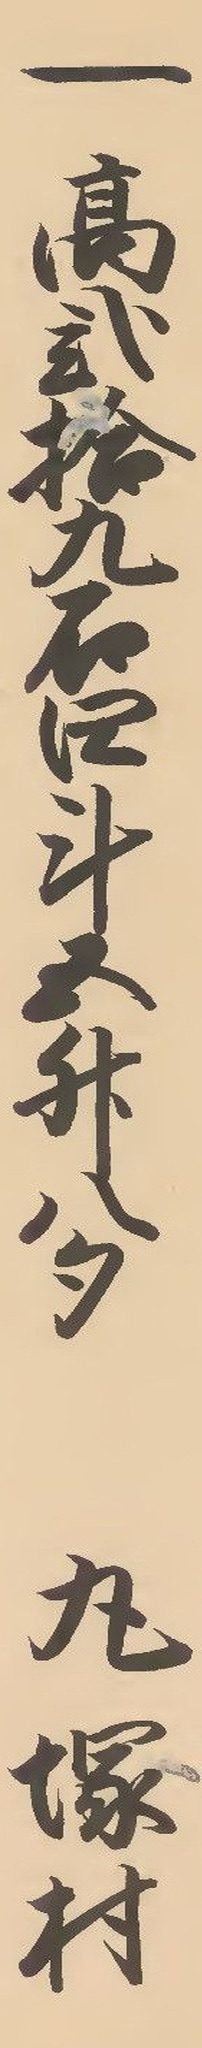一高弐拾九石四斗五升八勺丸塚村
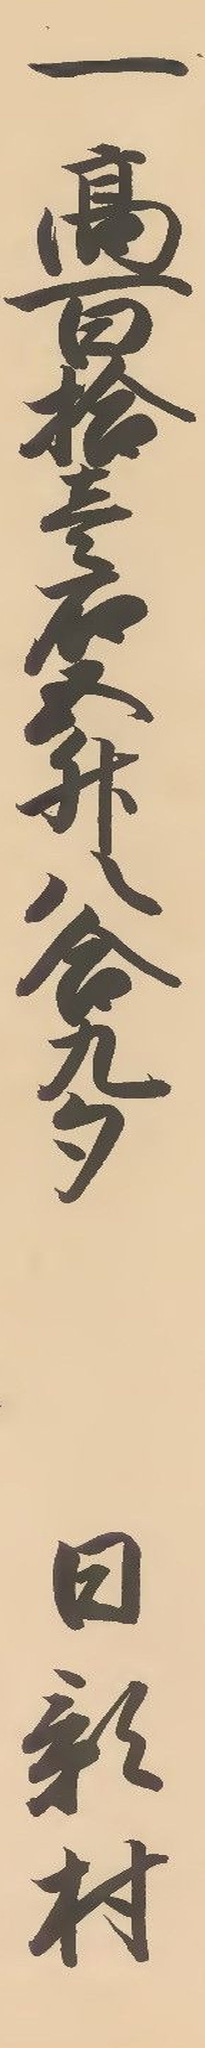一高百拾壱石五升八合九勺日影村
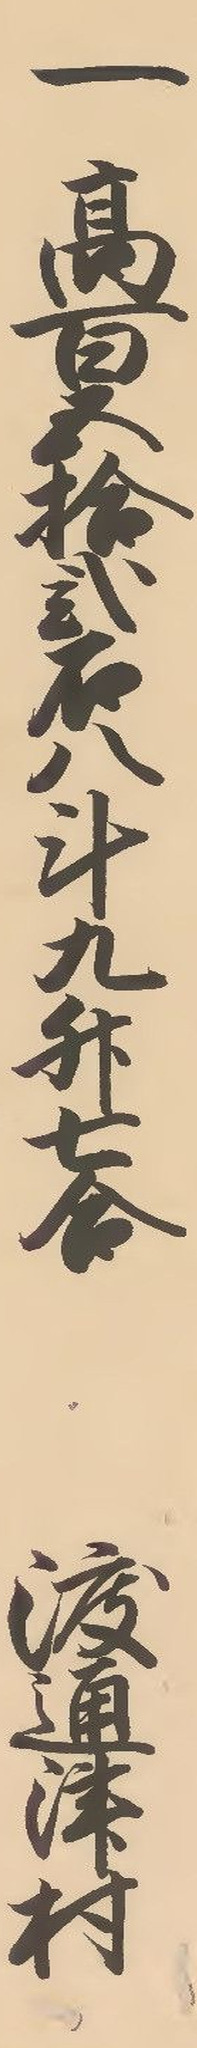一高百五拾弐石八斗九升七合渡通津村
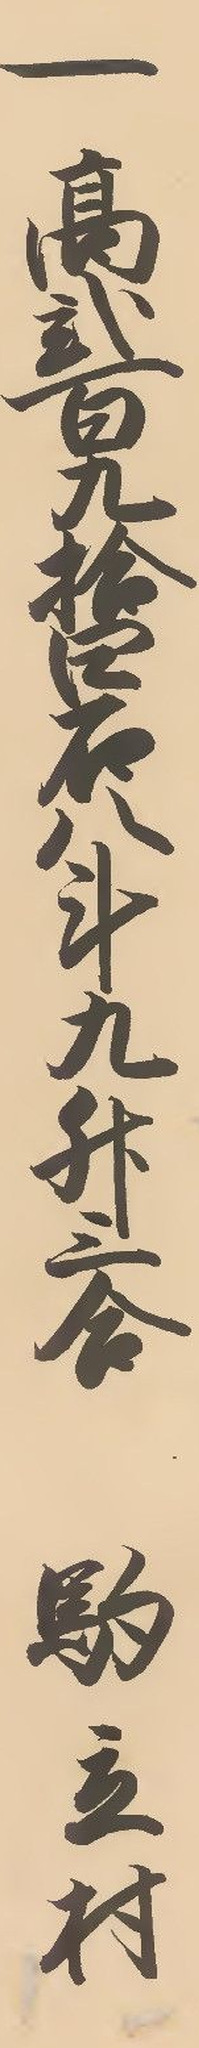一高弐百九拾四石八斗九升三合駒立村
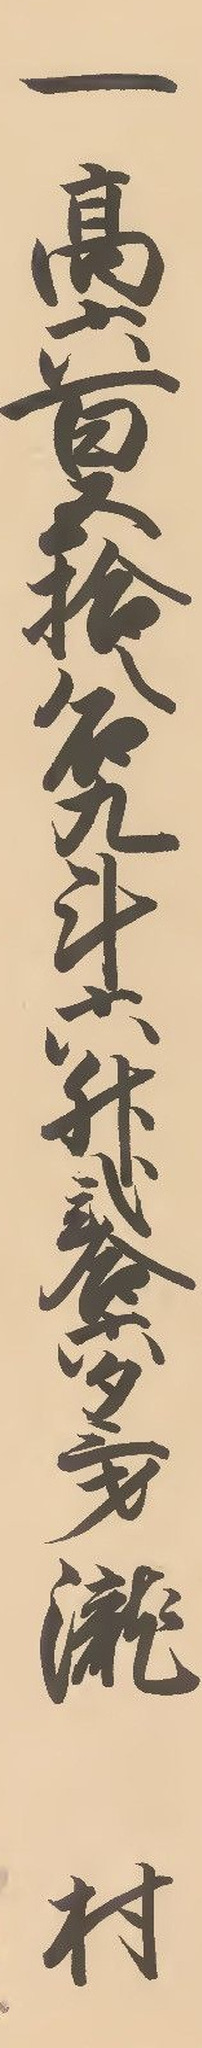一高六百五拾八石九斗六升弐合六勺三才滝村
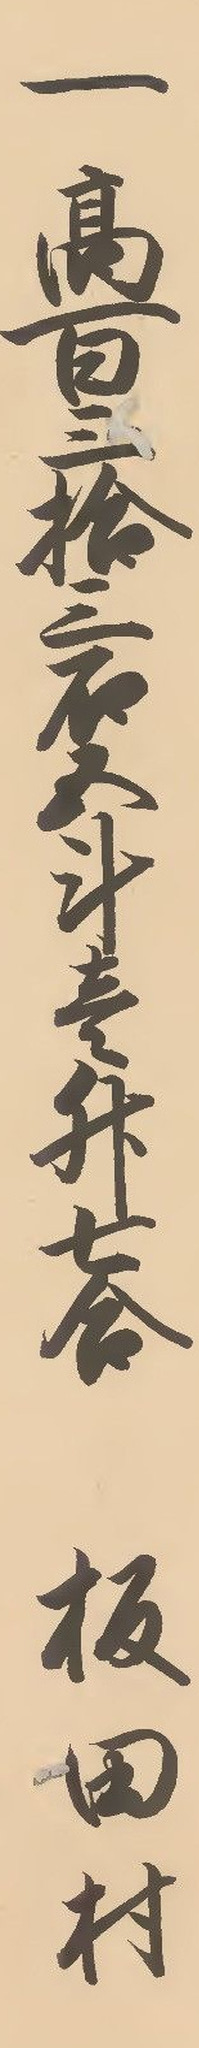一高百三拾三石五斗壱升七合板田村
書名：三河国郷帳
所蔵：国立公文書館 National Archives of Japan
